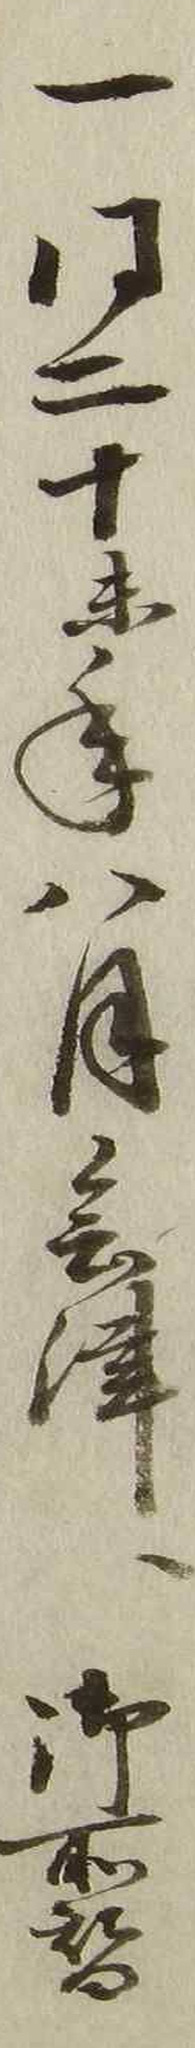一同二十未年八月会津へ御所替
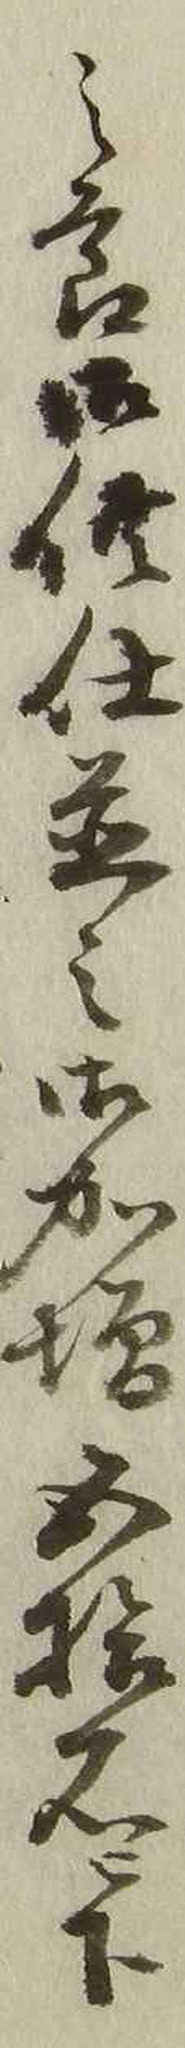之節御供仕並之御加増五拾石被下
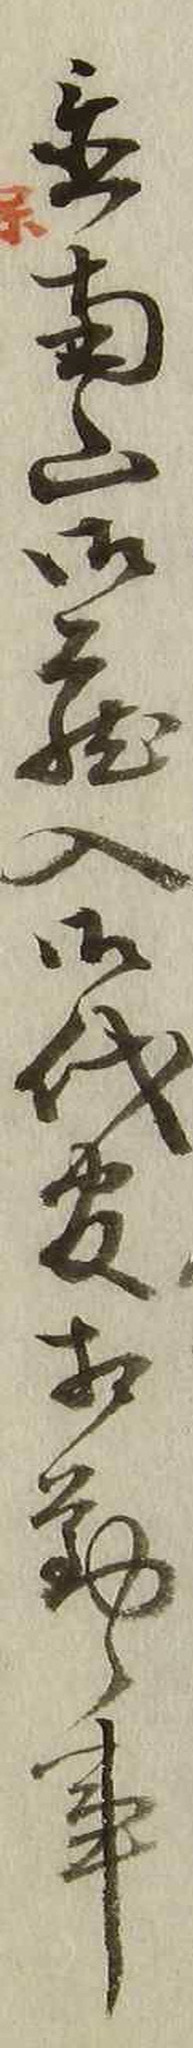置南山御蔵入御代官相勤候事
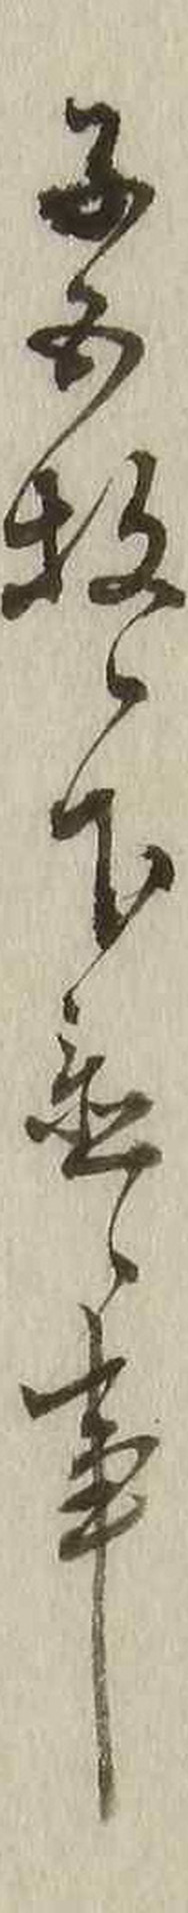子五枚被下置候事
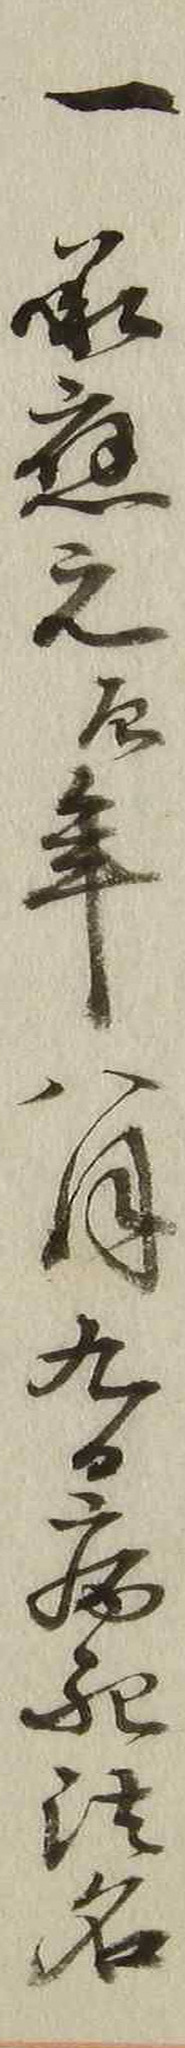一承応元辰年ハ月九日病死法名
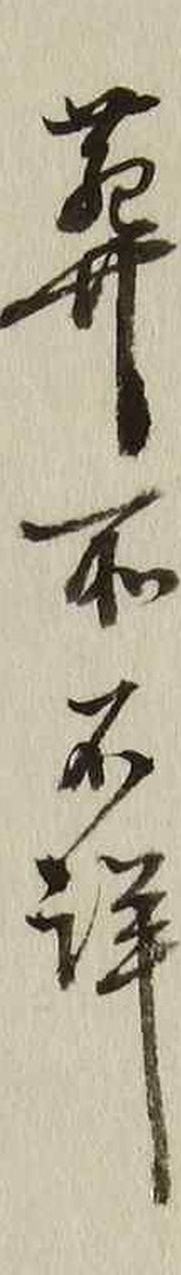葬所不詳
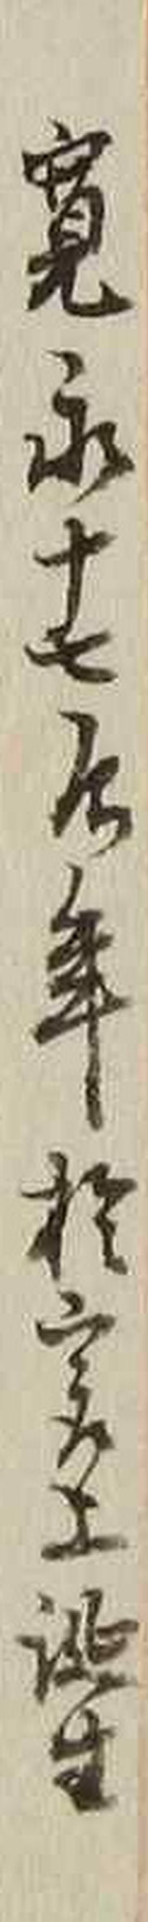寛永十七辰年於最上誕生
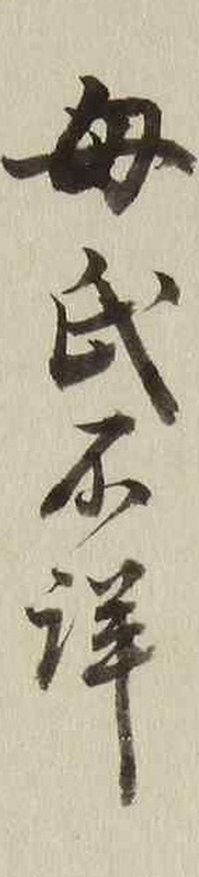母氏不詳
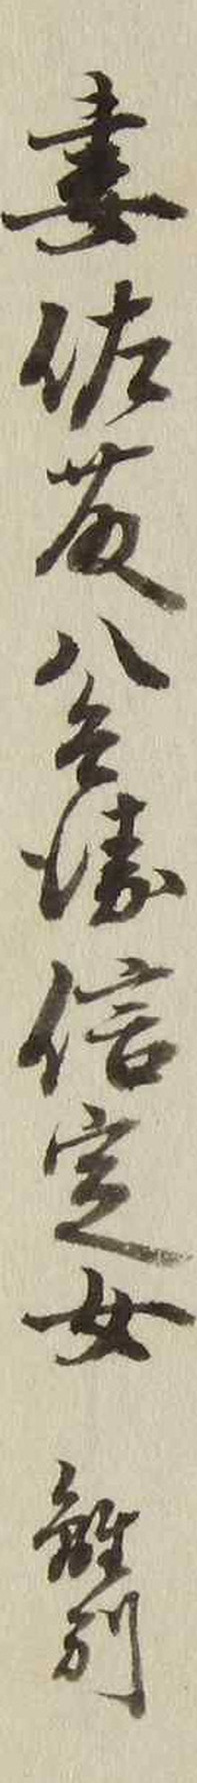妻佐藤八兵衛信定女離別
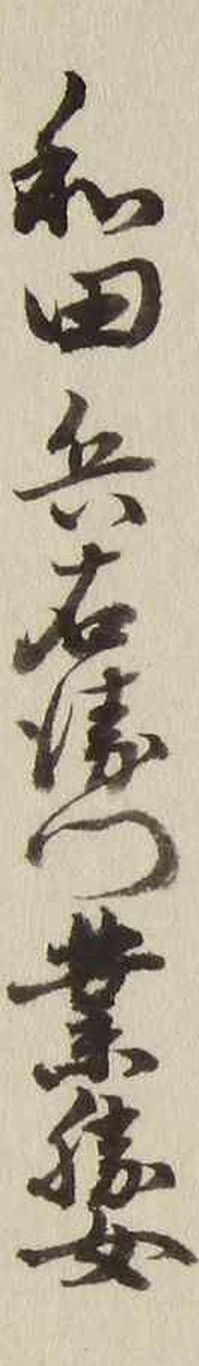和田兵右衛門業勝女
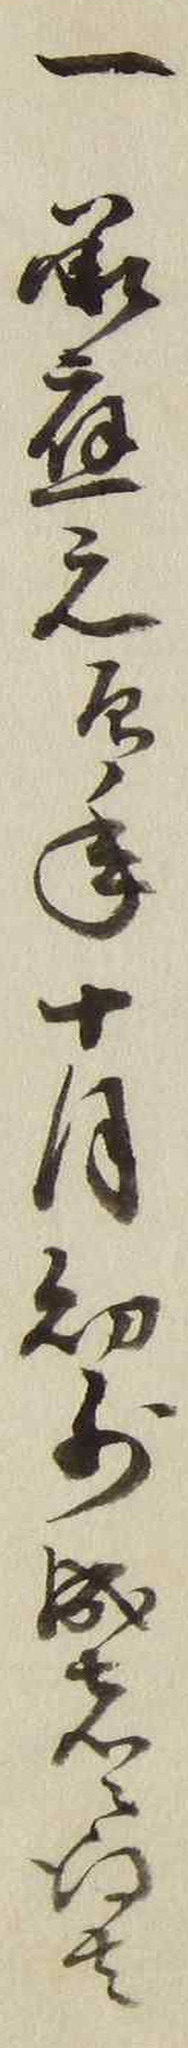一承応元辰年十月幼少成者ニ候得者

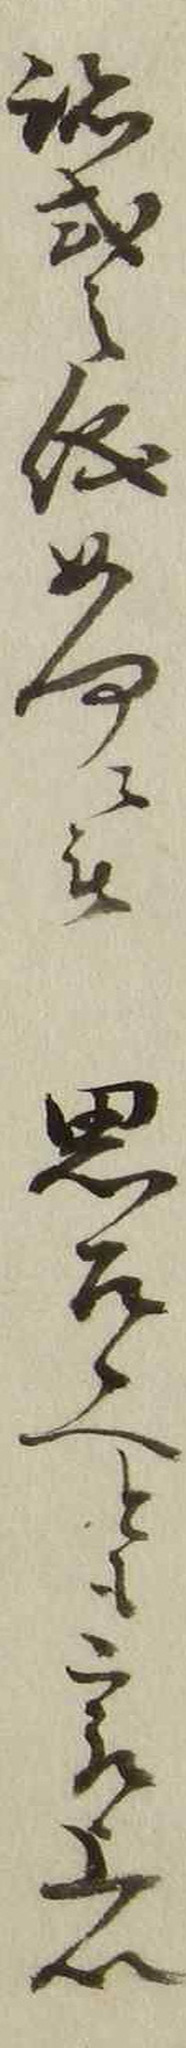跡式之儀如何ニ被思召候へとも最上以
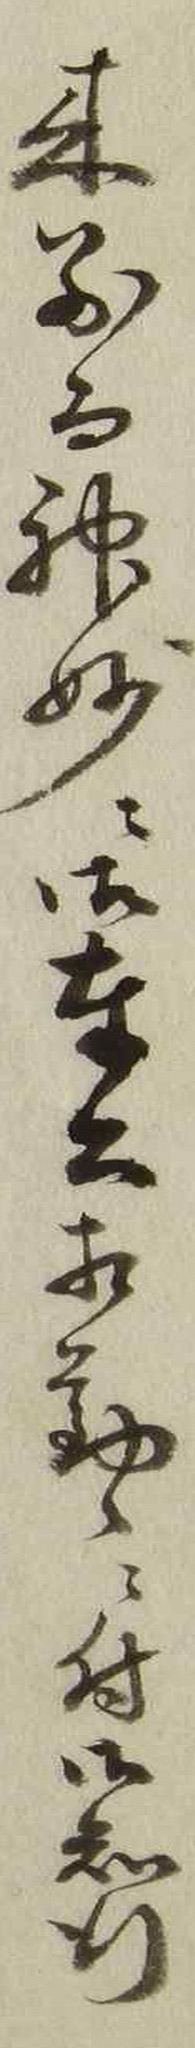来別而神妙ニ御奉公相勤候ニ付御知行
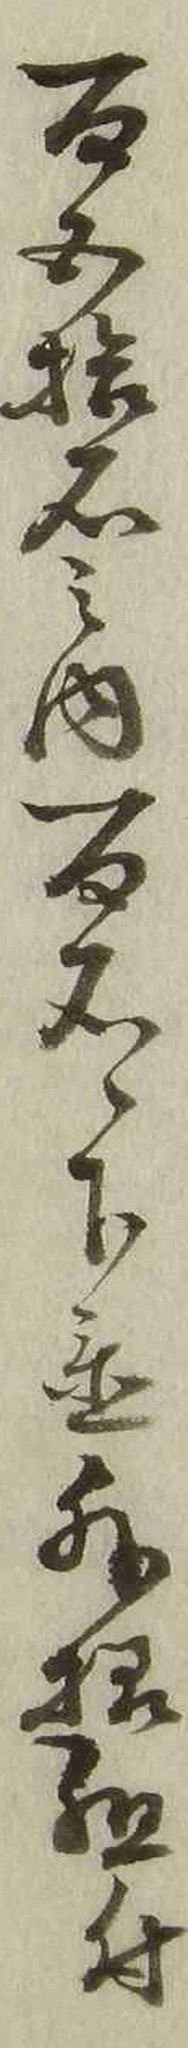百五拾石之内百石被下置外様組付
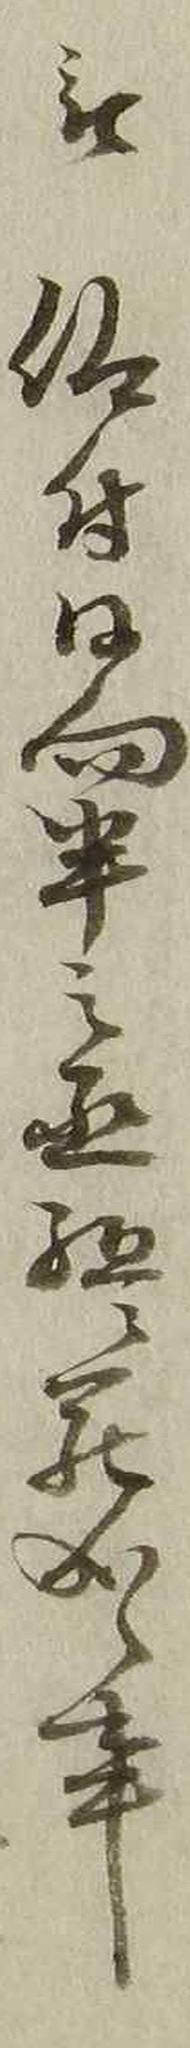被仰付日向半之丞組ニ罷成候事
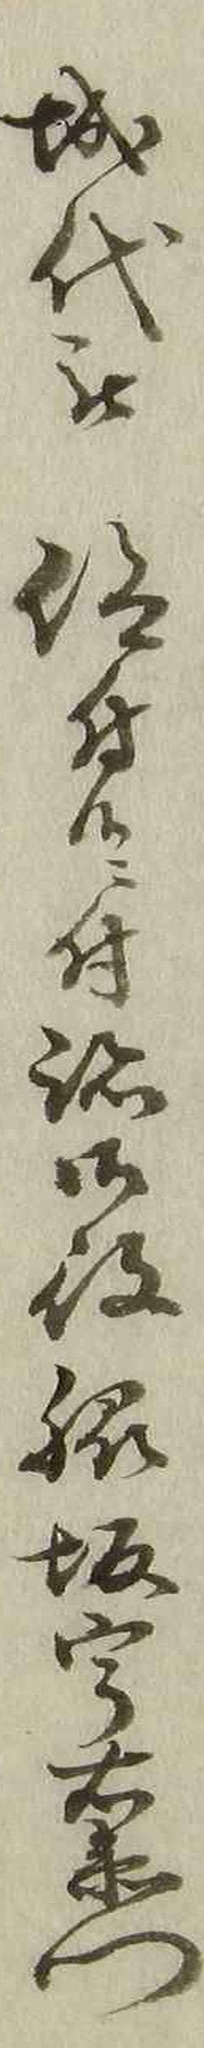城代被仰付候ニ付跡御役脇坂宇右衛門
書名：諸士系譜　巻之27　い之部27
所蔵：会津若松市立会津図書館
